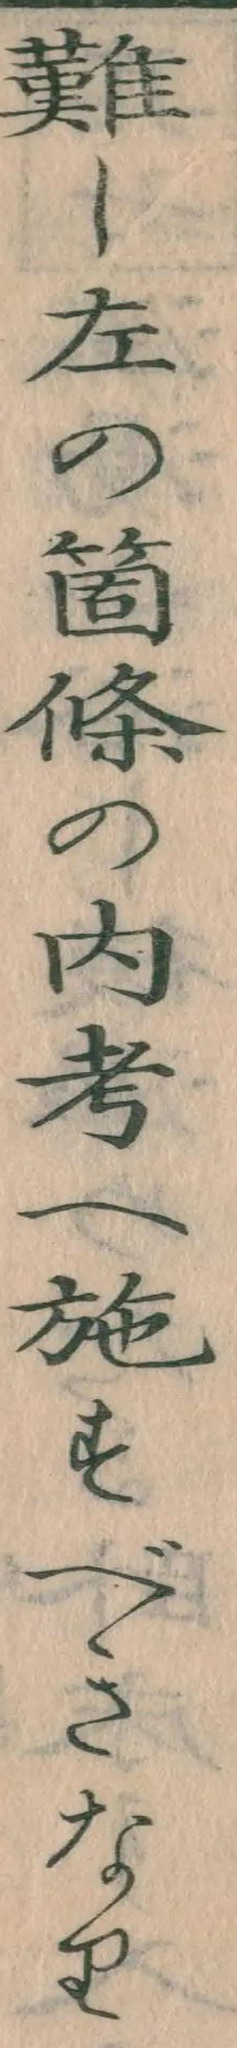難し左の箇条の内考へ施すべきなり
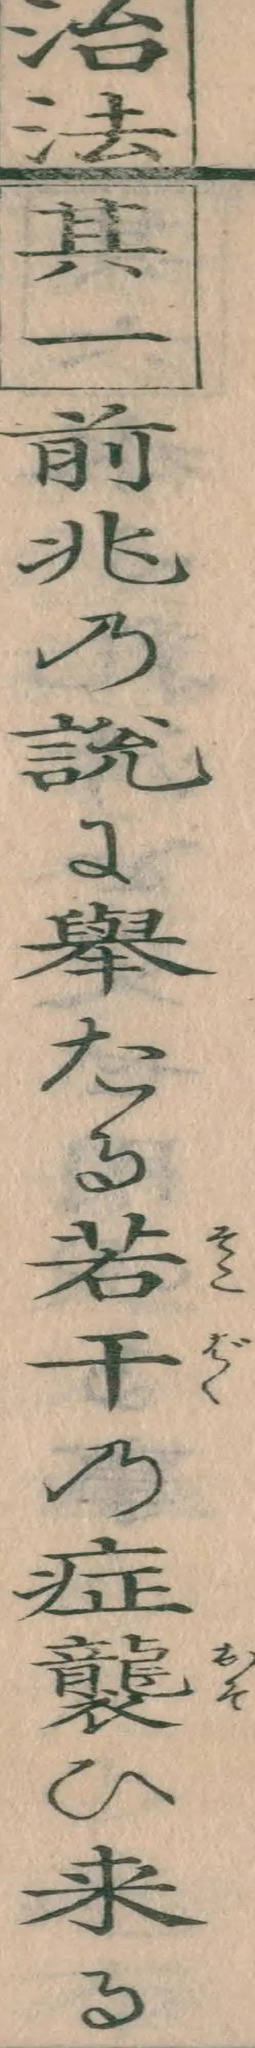治法其一前兆の説に挙たる若干の症襲ひ来る
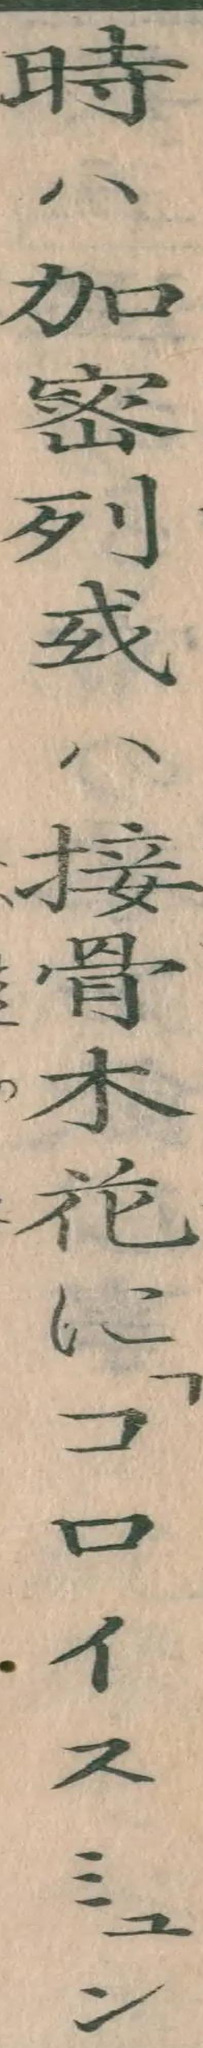時は加密列或は接骨木花に「コロイスミュン

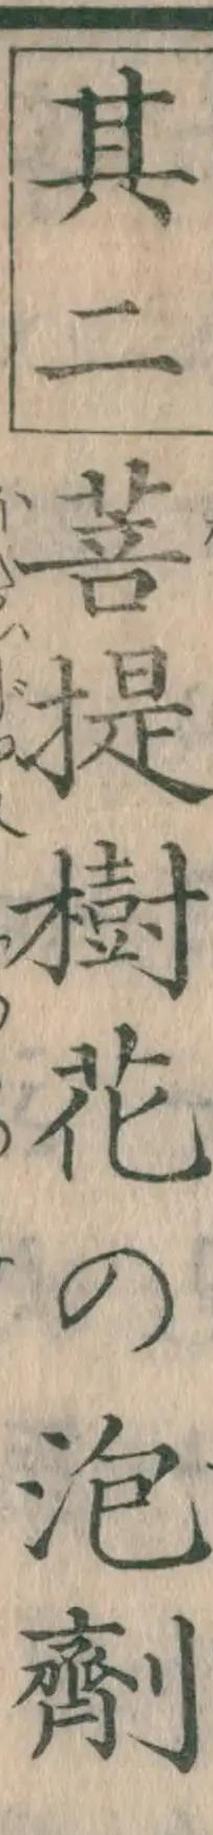其二菩提樹花の泡剤
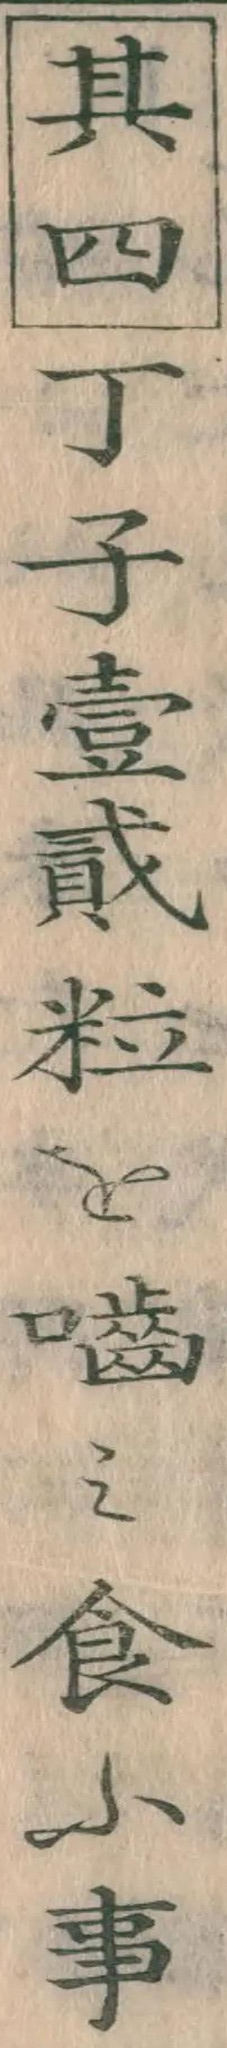其四丁子壱弐粒を嚙み食ふ事
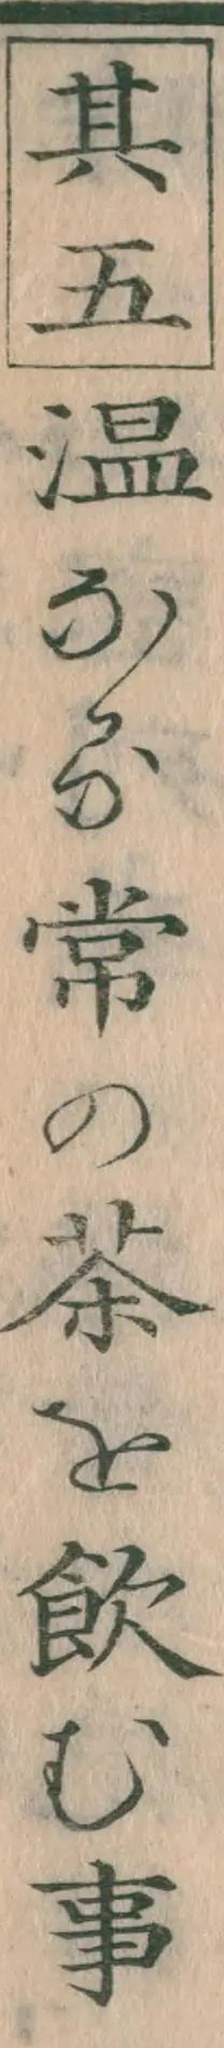其五温なる常の茶を飲む事
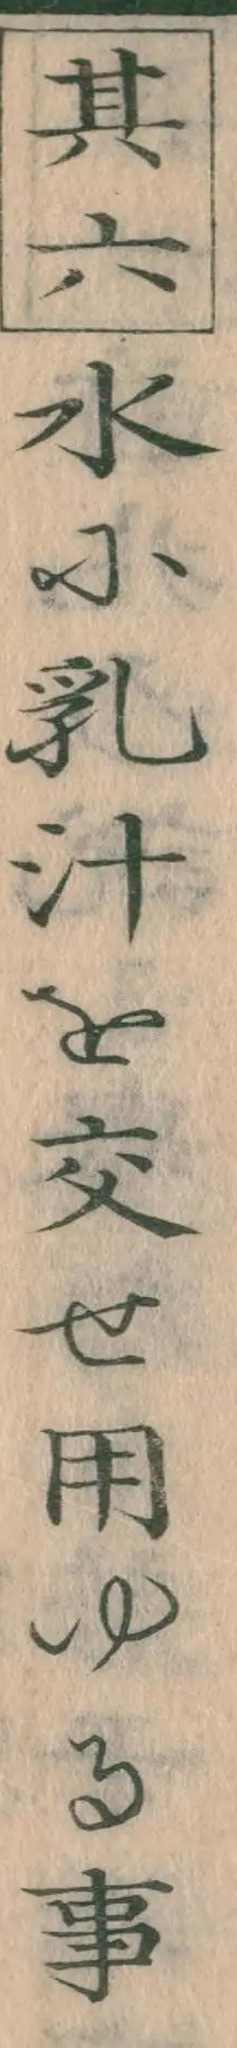其六水に乳汁を交せ用ゆる事
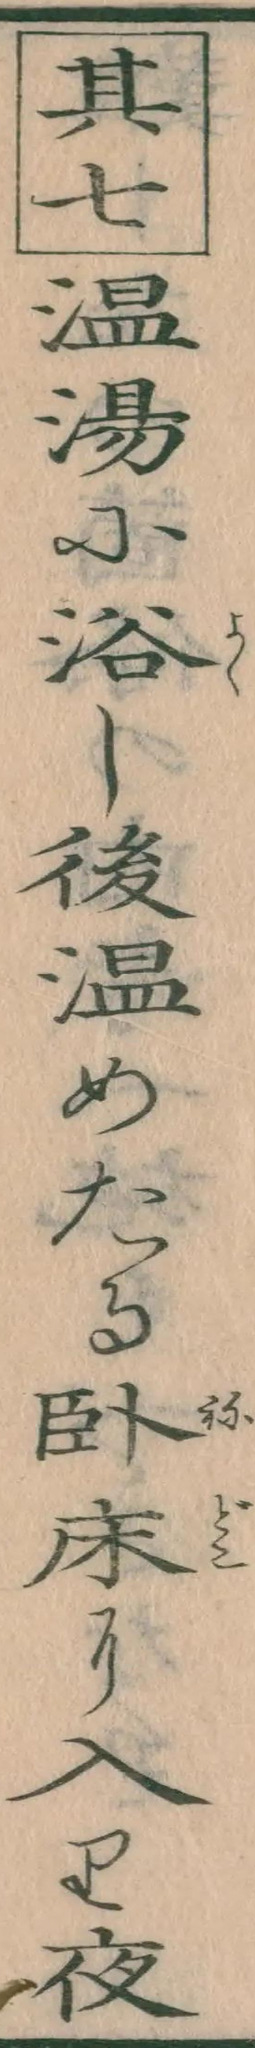其七温湯に浴し後温めたる臥床に入り夜
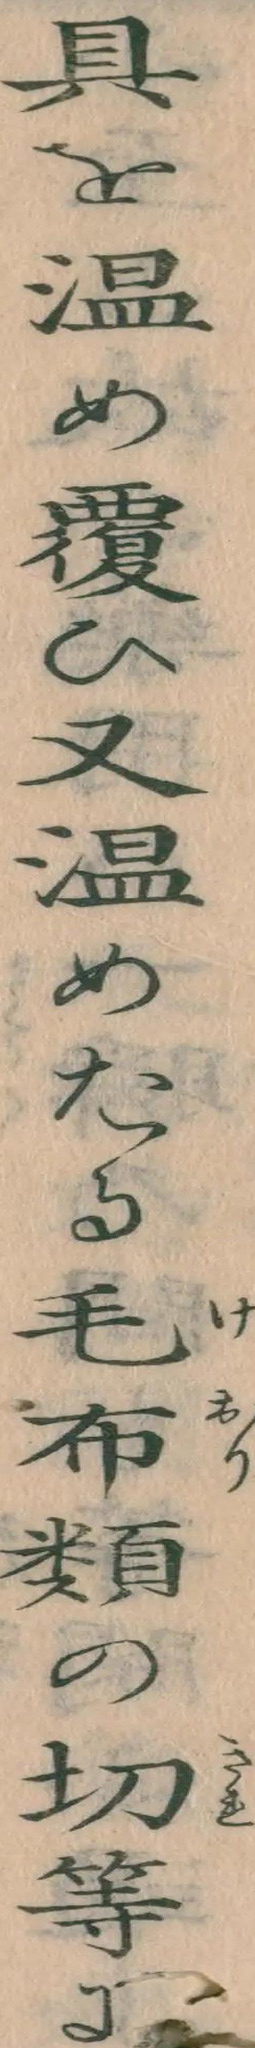具を温め覆ひ又温めたる毛布類の切等に
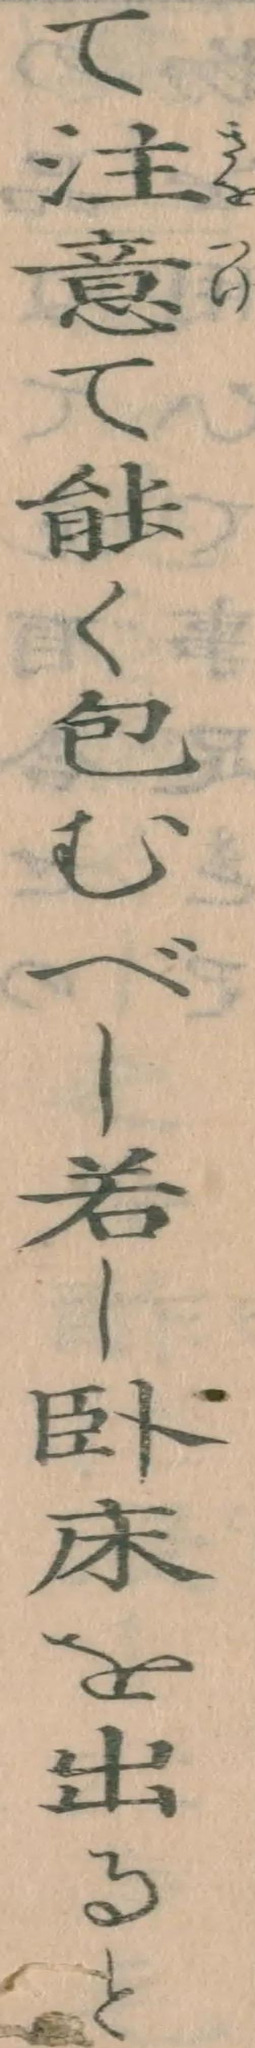て注意て能く包むべし若し臥床を出ると
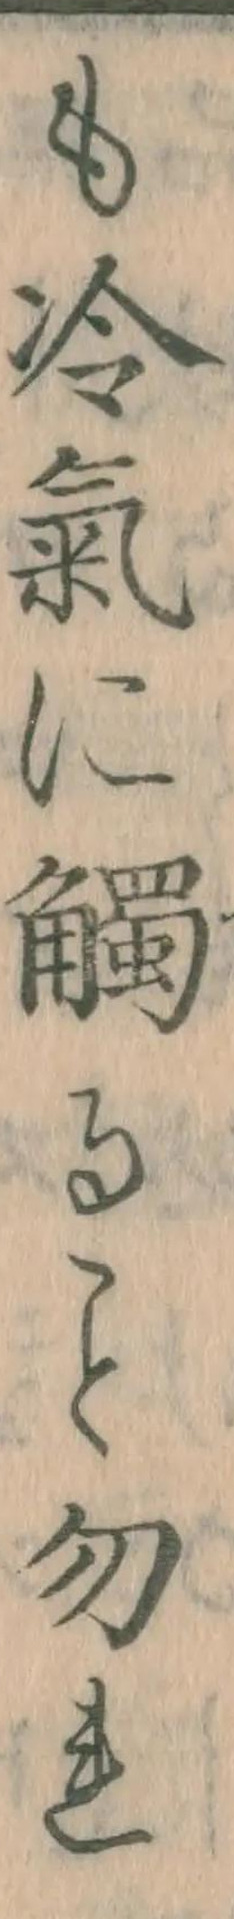も冷気に触ること勿れ
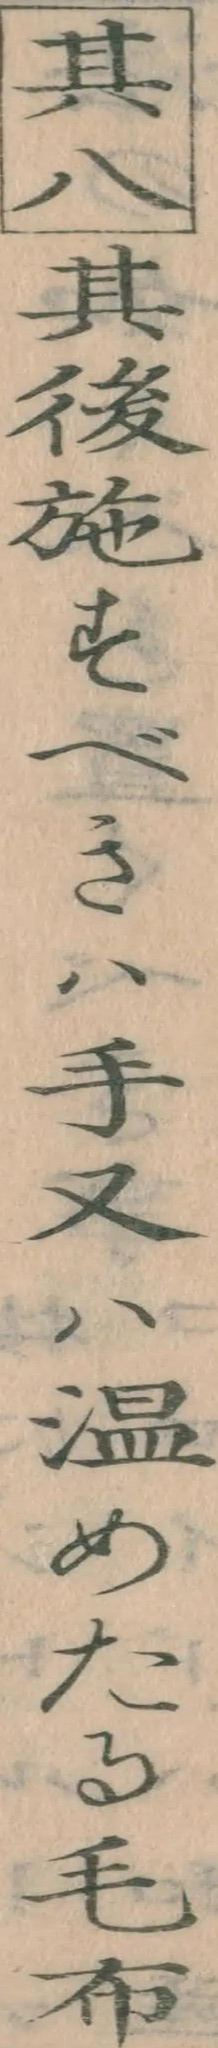其八其後施すべきは手又は温めたる毛布
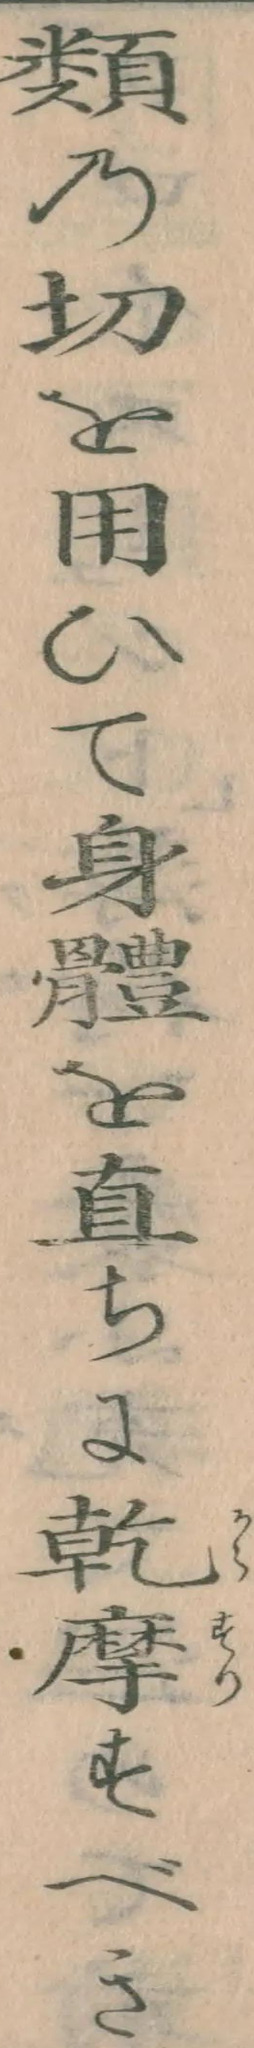類の切を用ひて身体を直ちに乾摩すべき
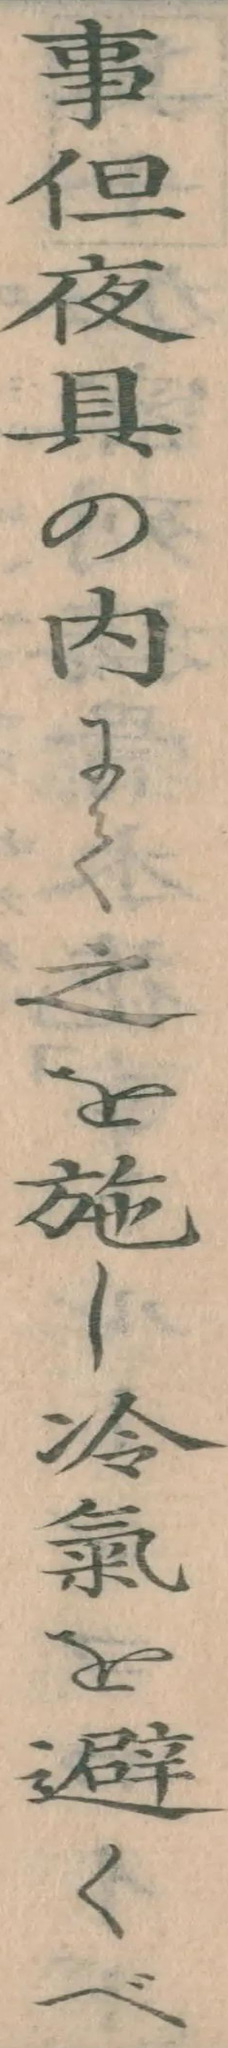事但夜具の内にて之を施し冷気を避くべ
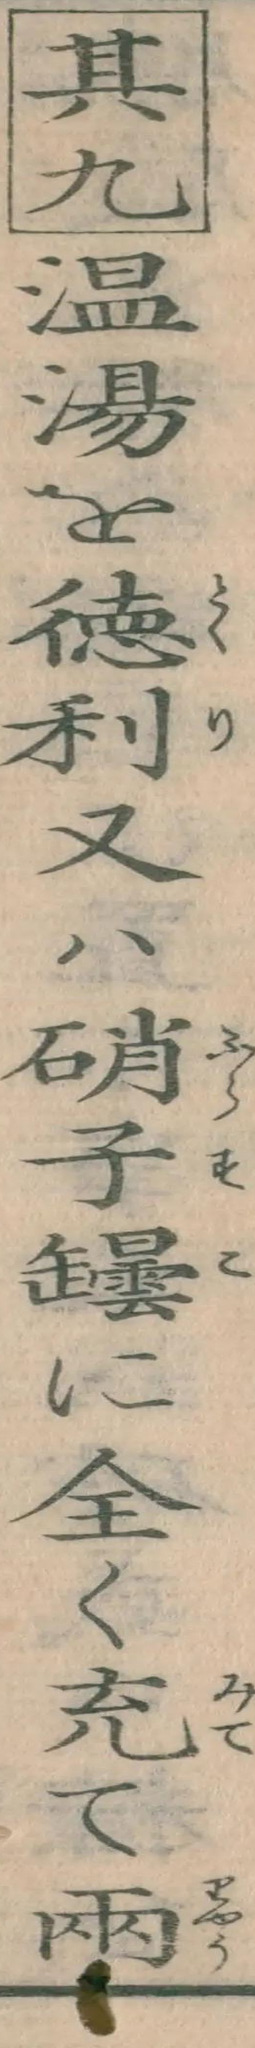其九温湯を徳利又は硝子罎に全く充て両

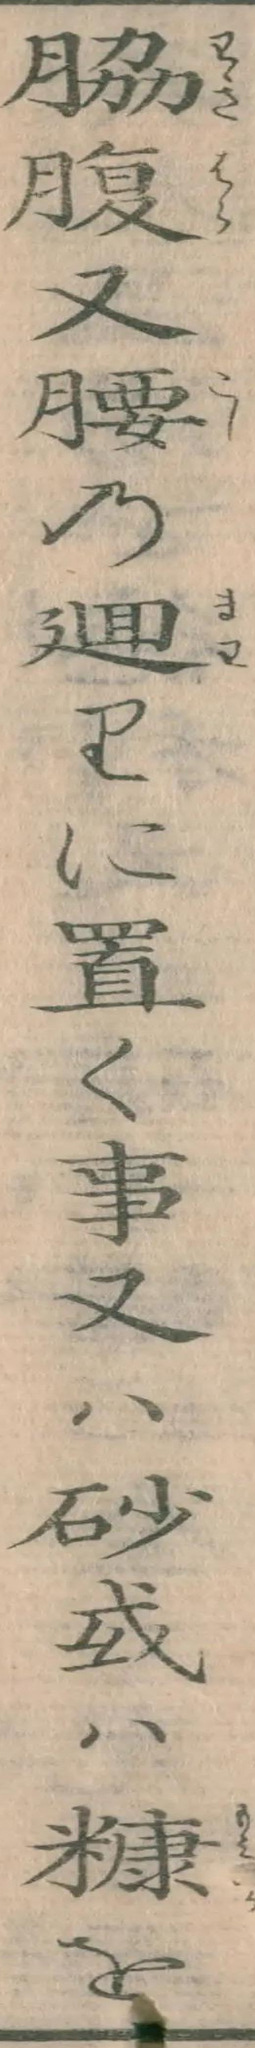脇腹又腰の廻りに置く事又は砂或は糠を
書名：暴瀉病手当素人心得書
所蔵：国立国会図書館 National Diet Library, JAPAN
